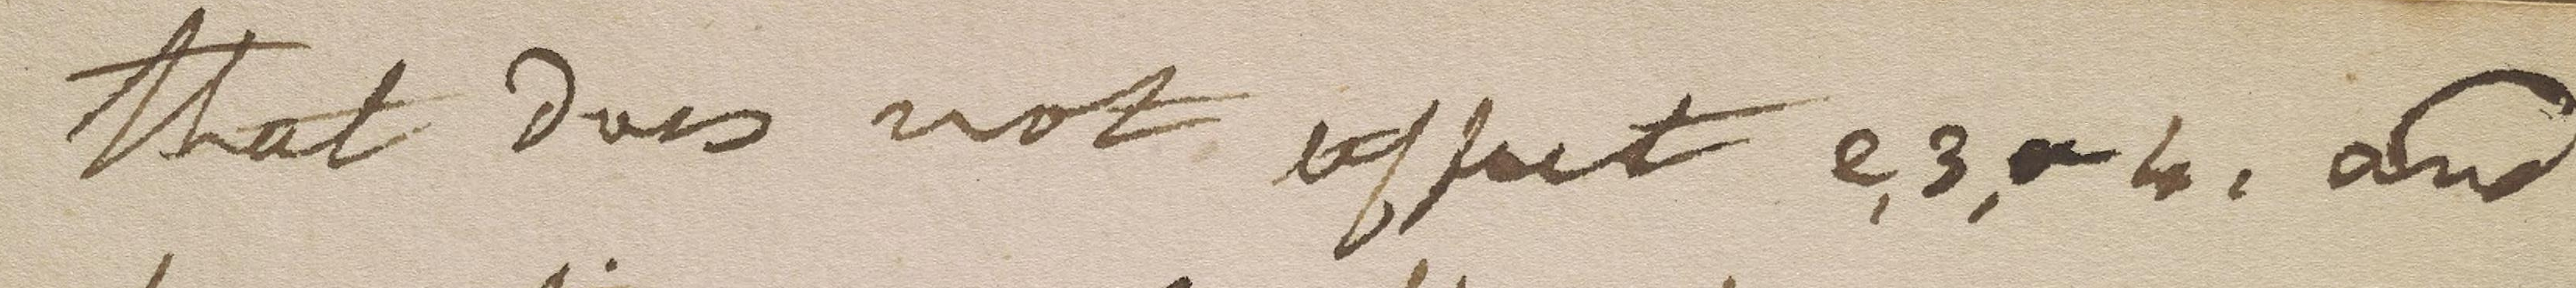that does not effect 2, 3, & 4, and
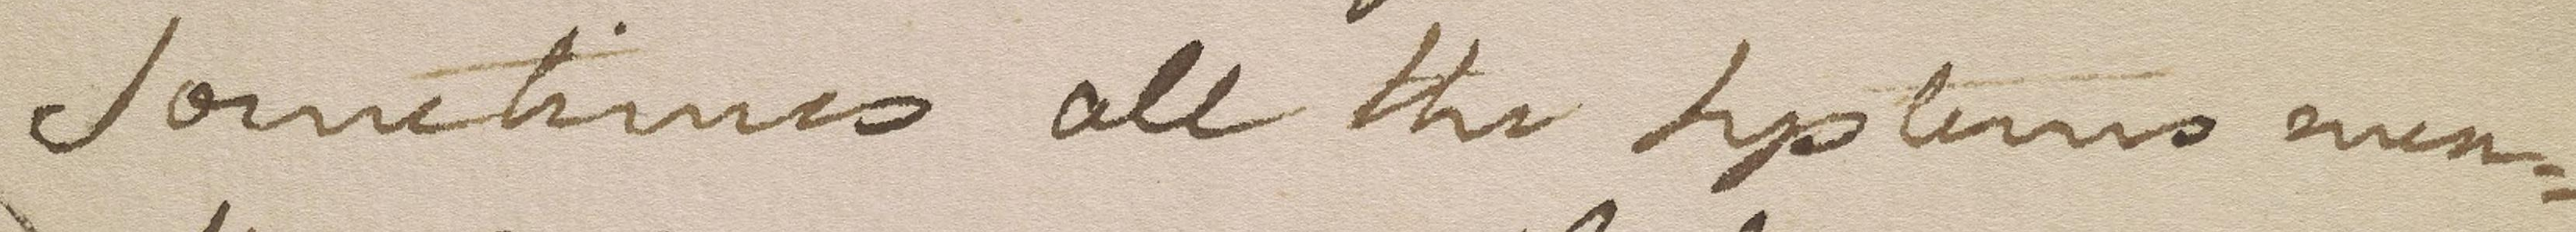sometimes all the systems enter-
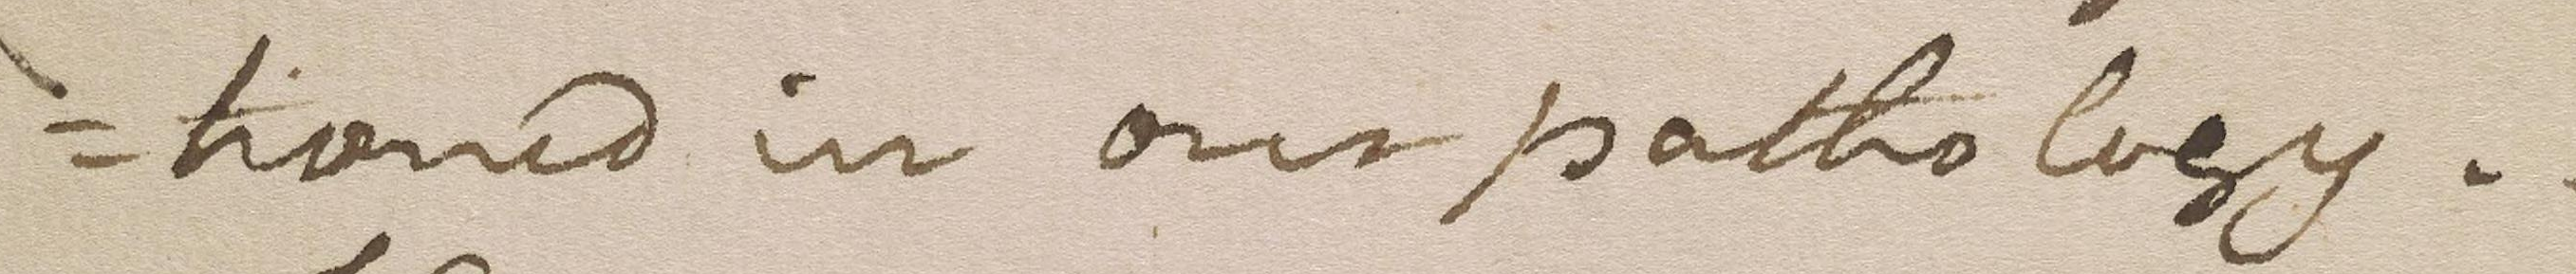-tained in our pathology.
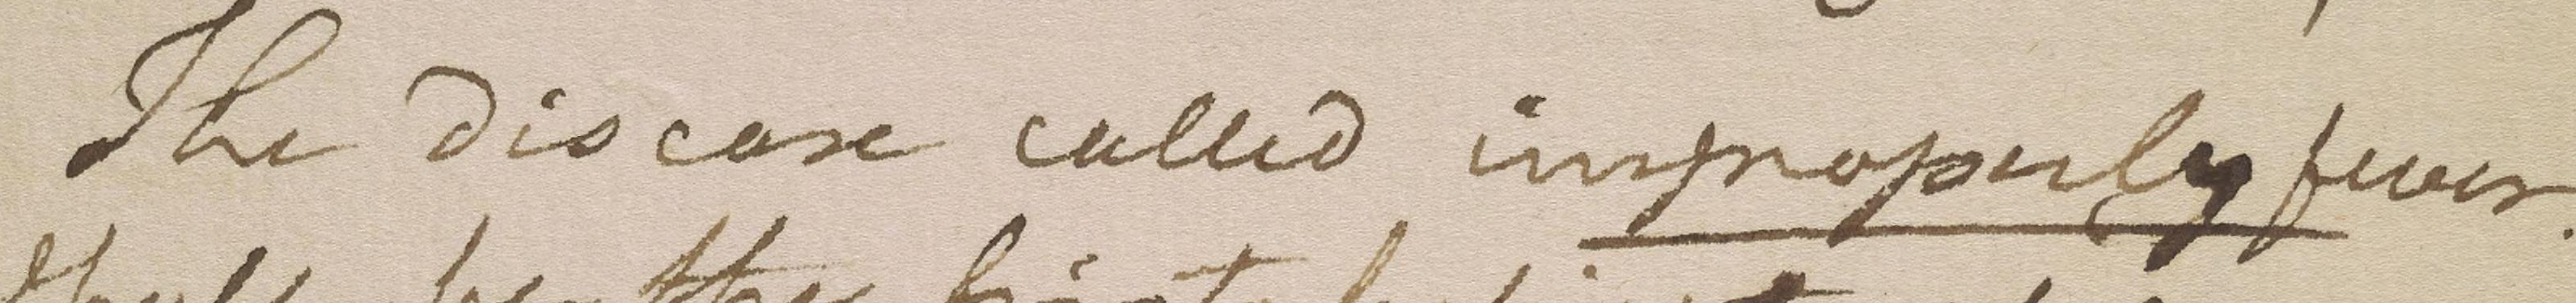The disease called improperly fever
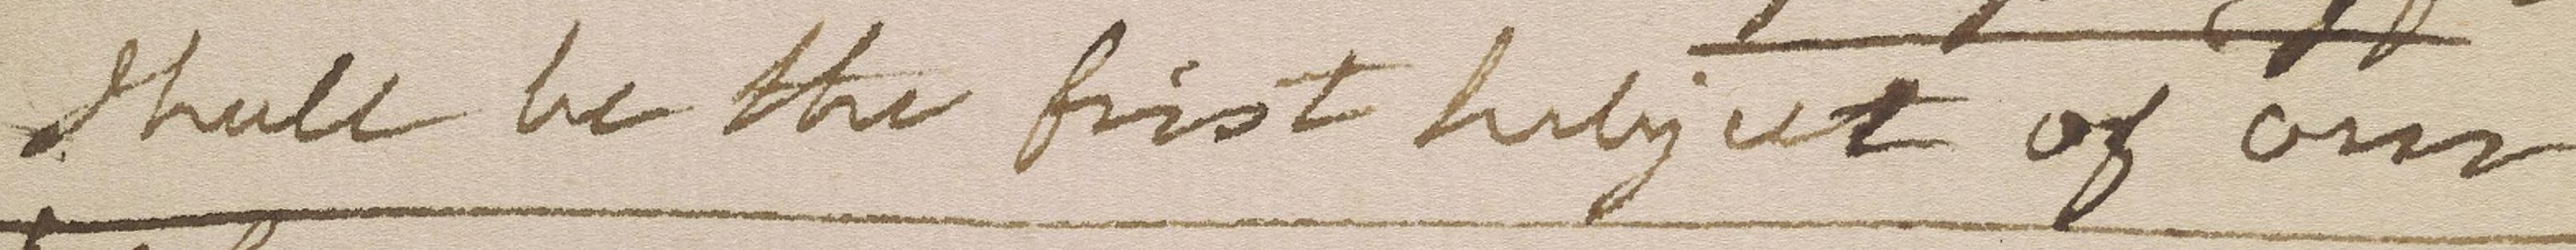shall be the first subject of our
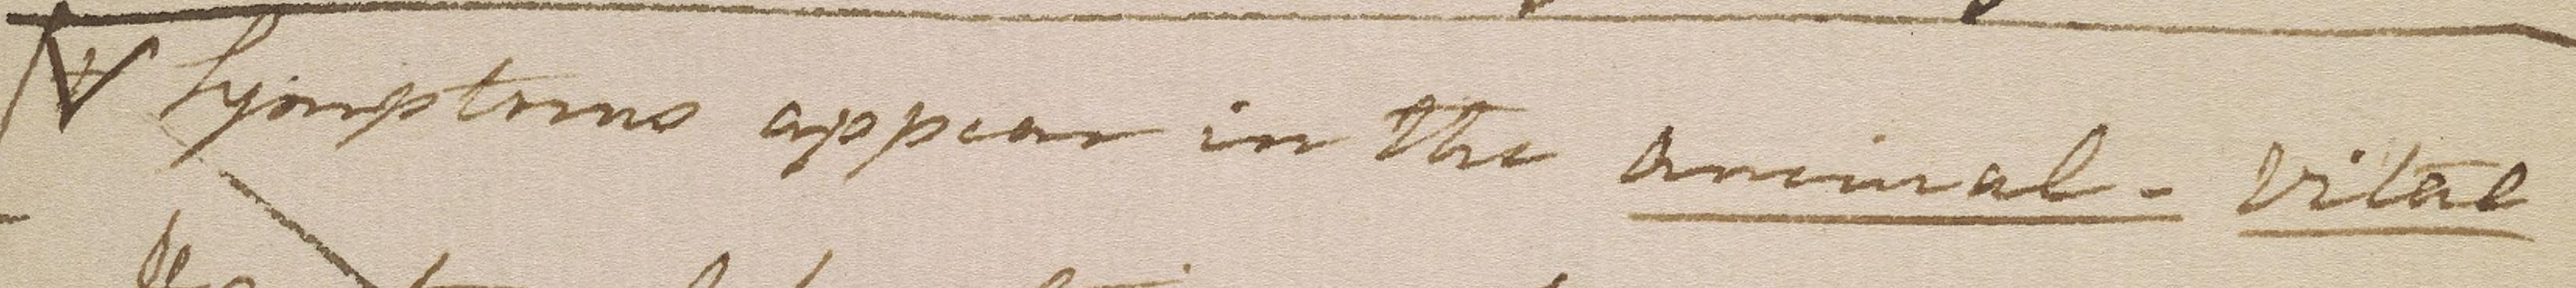V Symptoms appear in the animal, vital
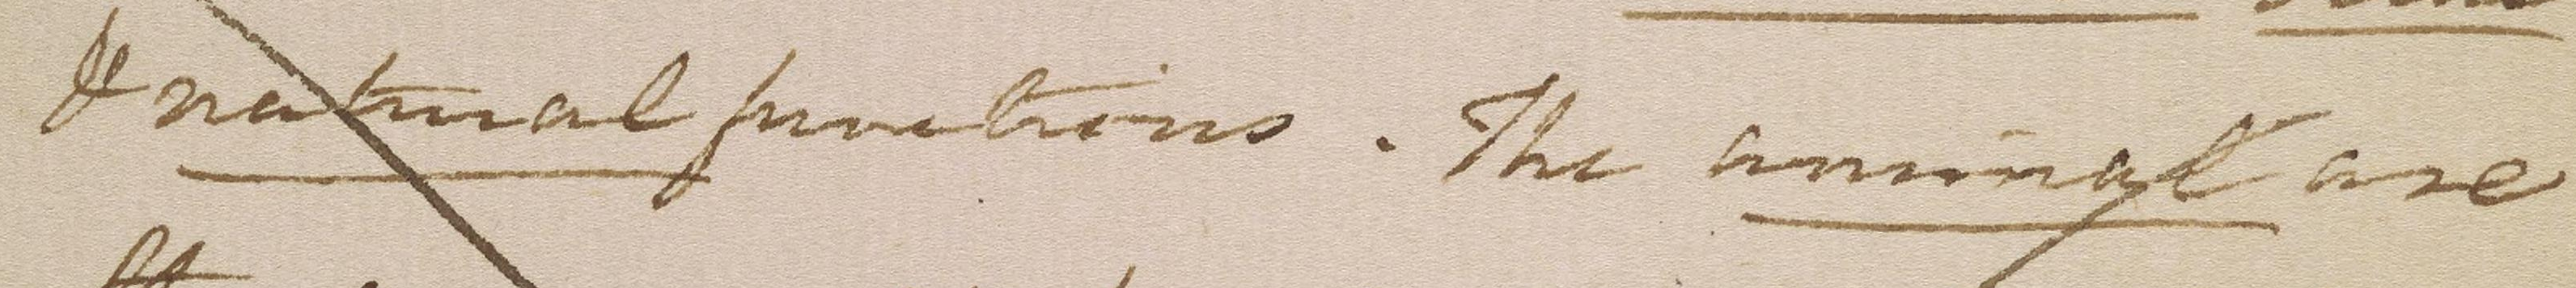& natural formations. The animal are
